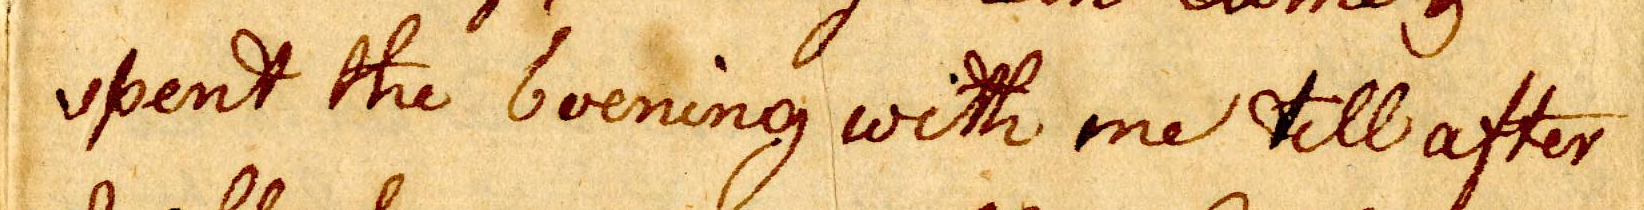spent the Evening with me till after
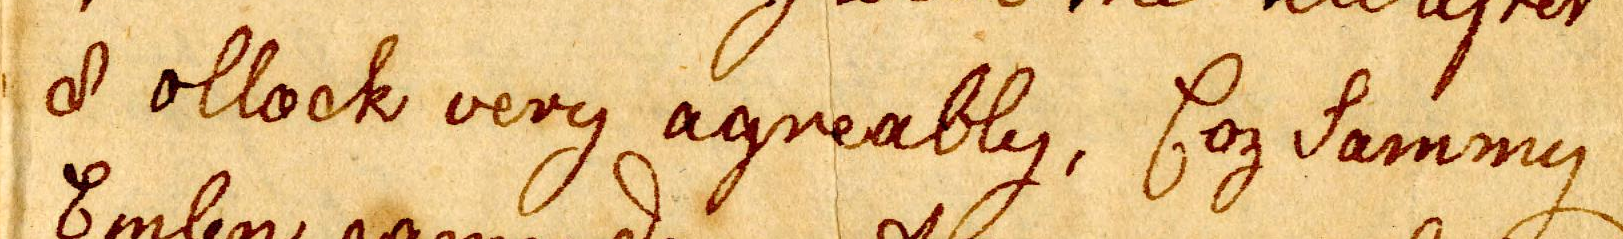8 ^o Clock very agreably, Coz Sammy
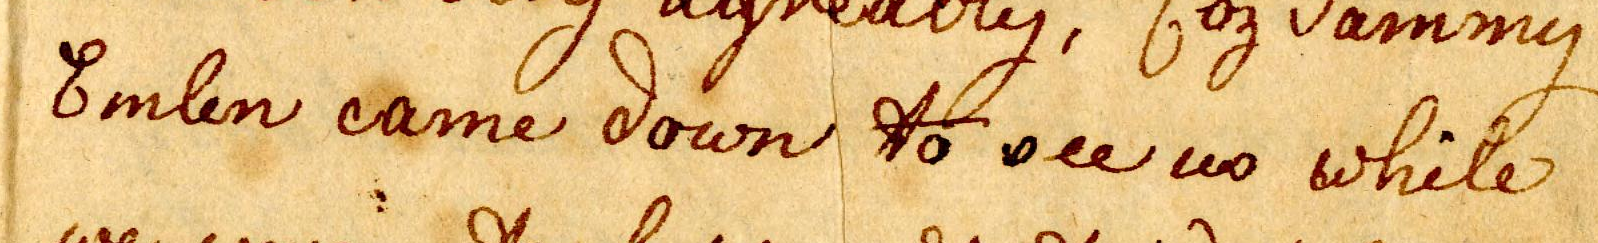Emlen came down to see us while
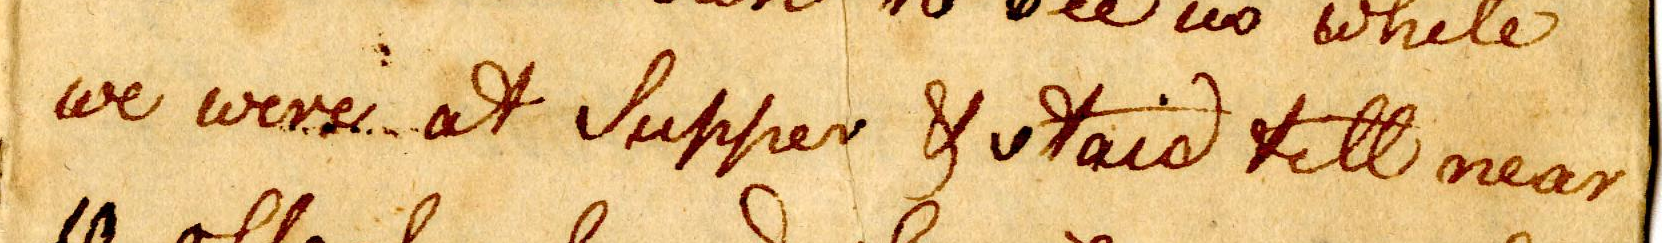we were at Supper & staid till near
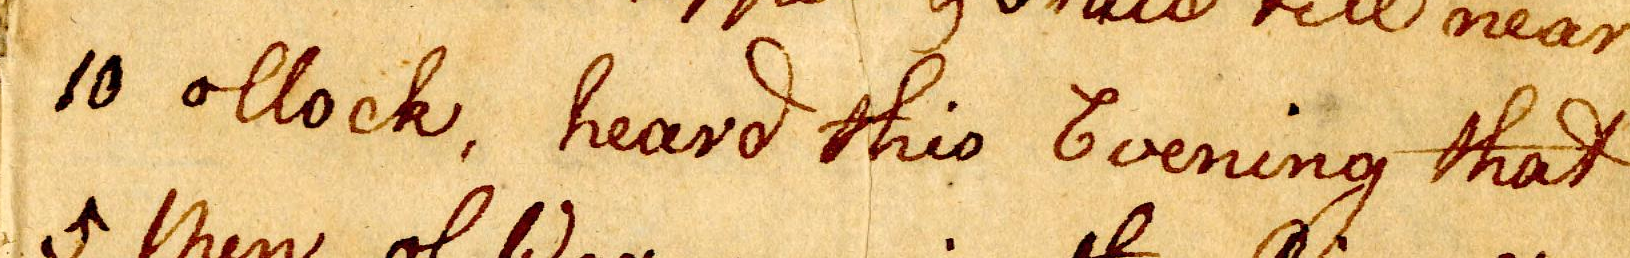10 ^o Clock, heard this Evening that
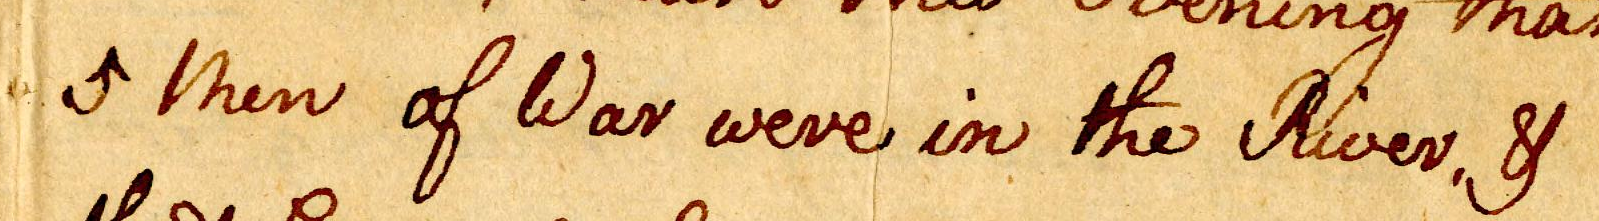5 Men of War were in the River, &
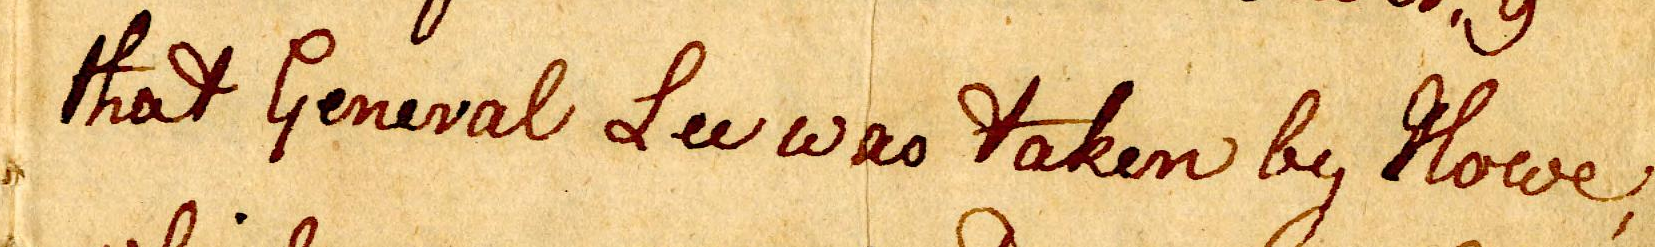that General Lee was taken by Howe,
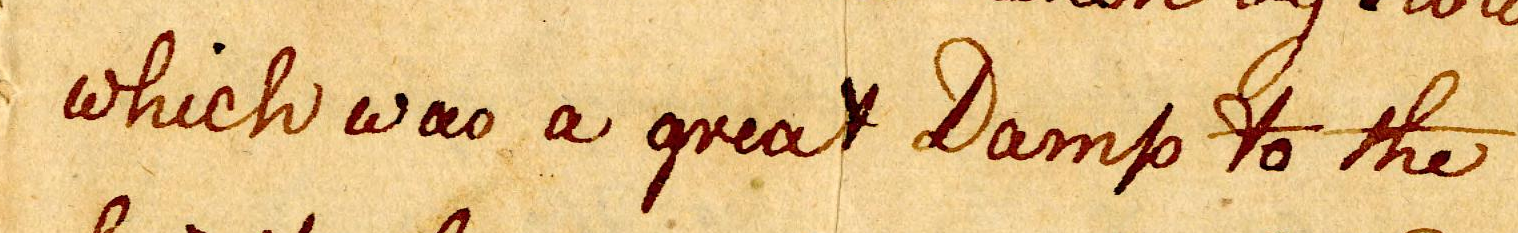which was a great Damp to the
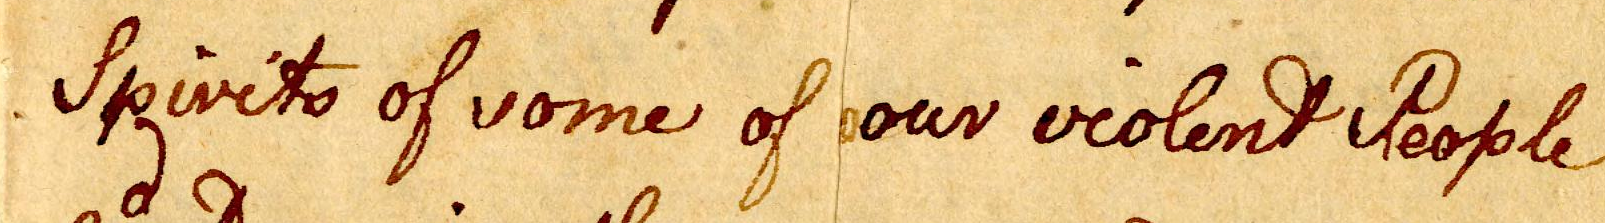Spirits of some of our violent People
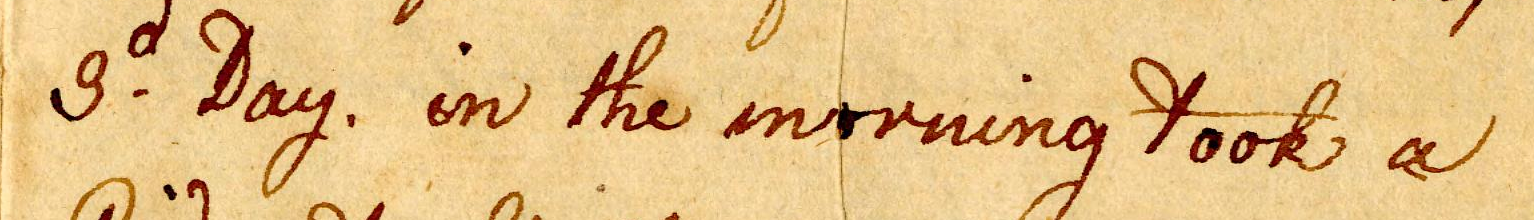3^d Day. in the morning took a
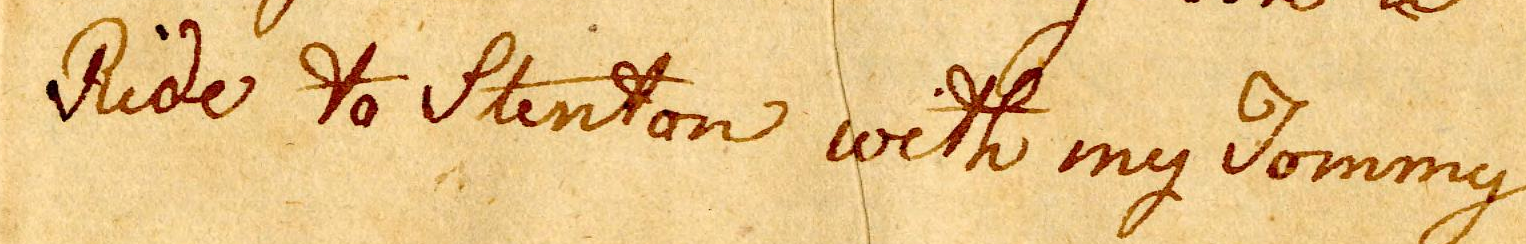Ride to Stenton with my Tommy
